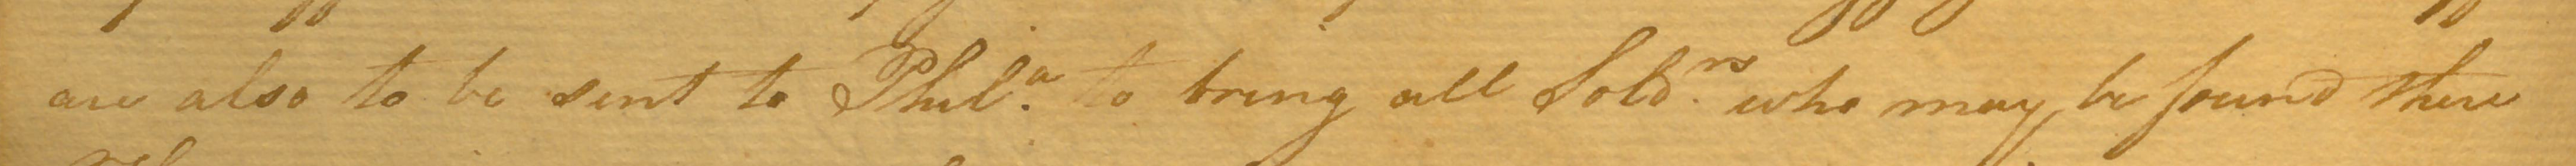are also to be sent to Phil^a. to bring all Sold^rs. who may be found there
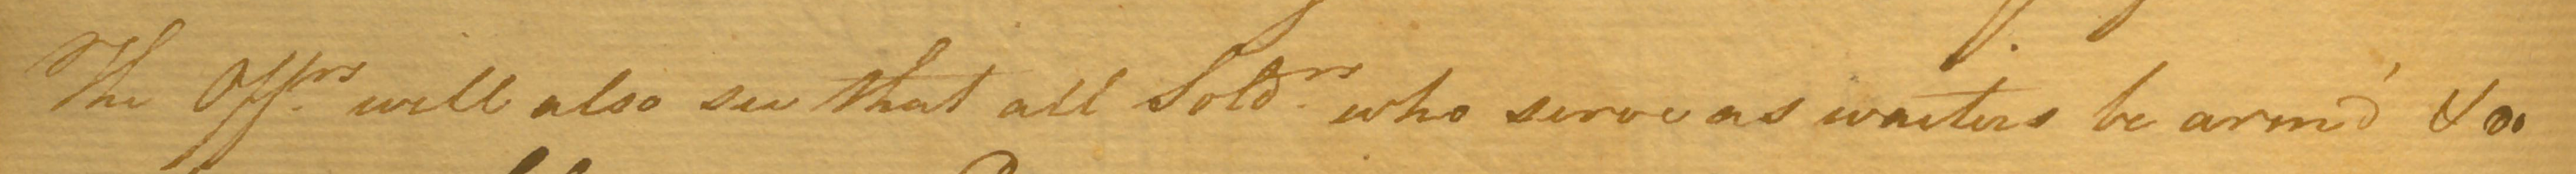The Off^rs. will also see that all Sold^rs. who serve as waiters be arm'd & do
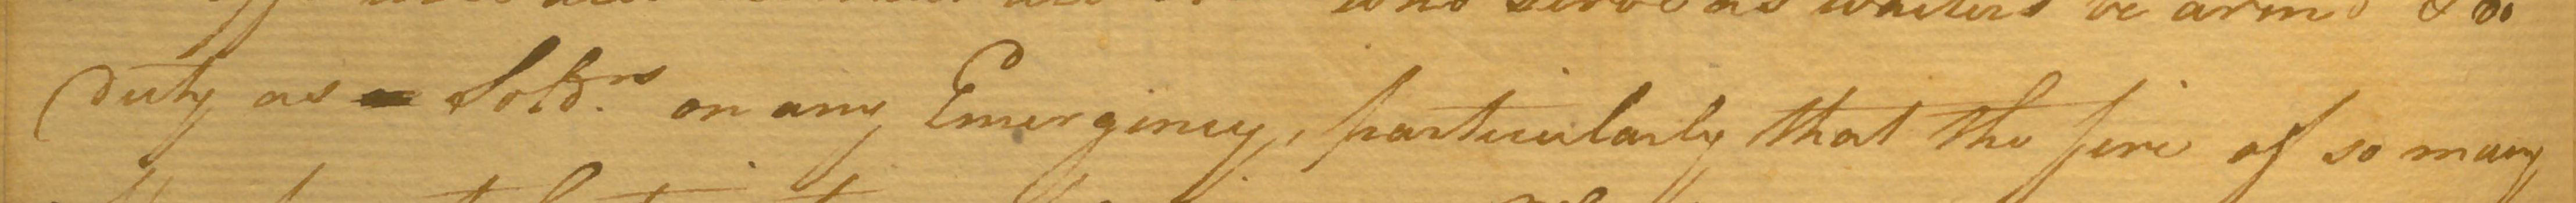duty as [_] Sold^rs. on any Emergincy, particularly that the fire of so many
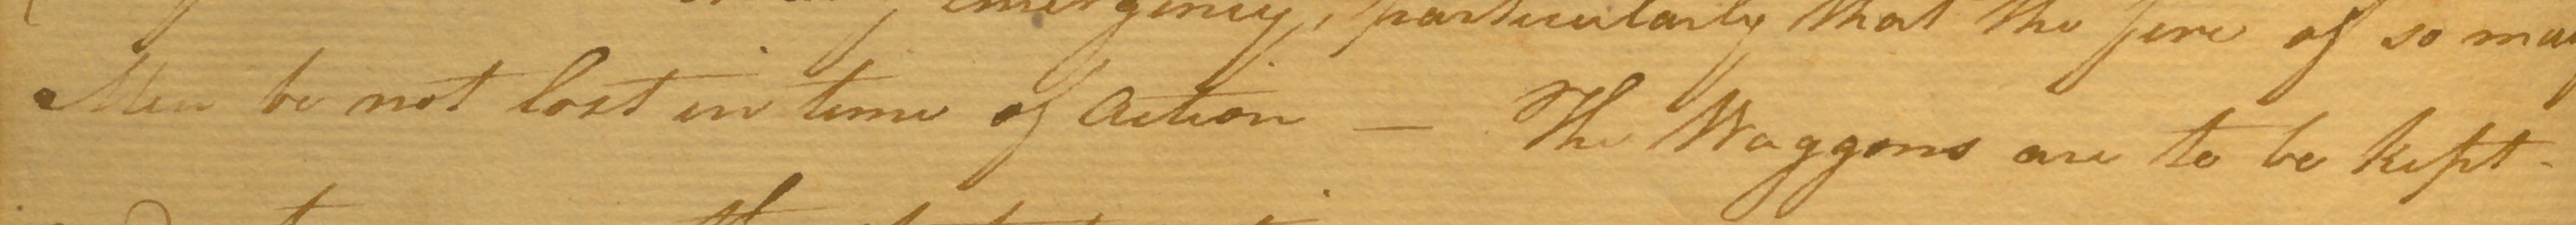Men be not lost in time of Action- The Waggons are to be kept
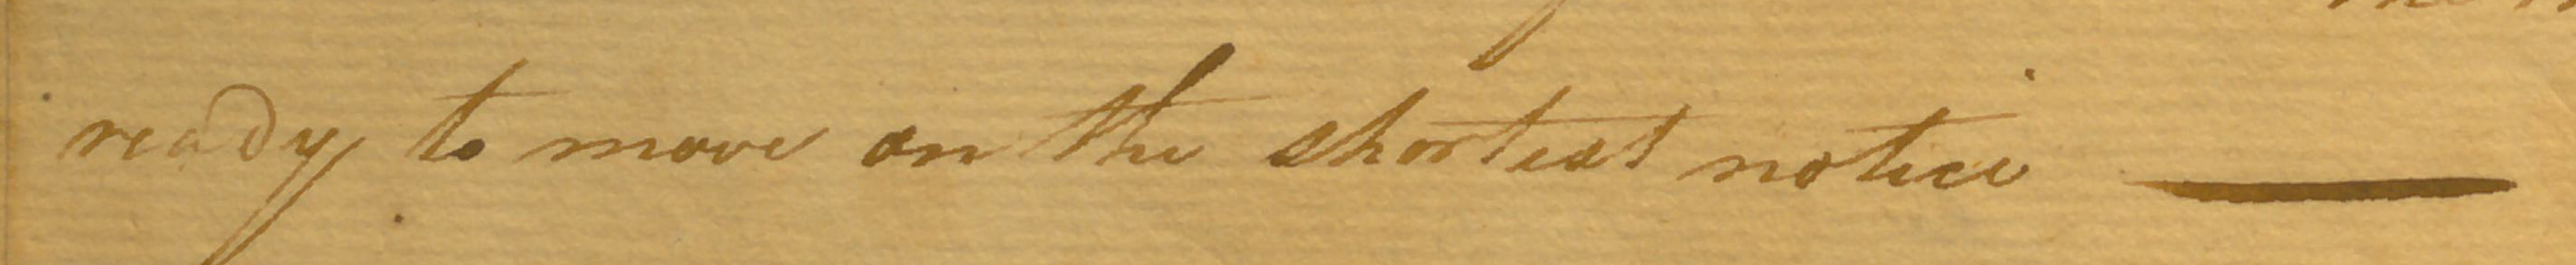ready to move on the shortest notice-
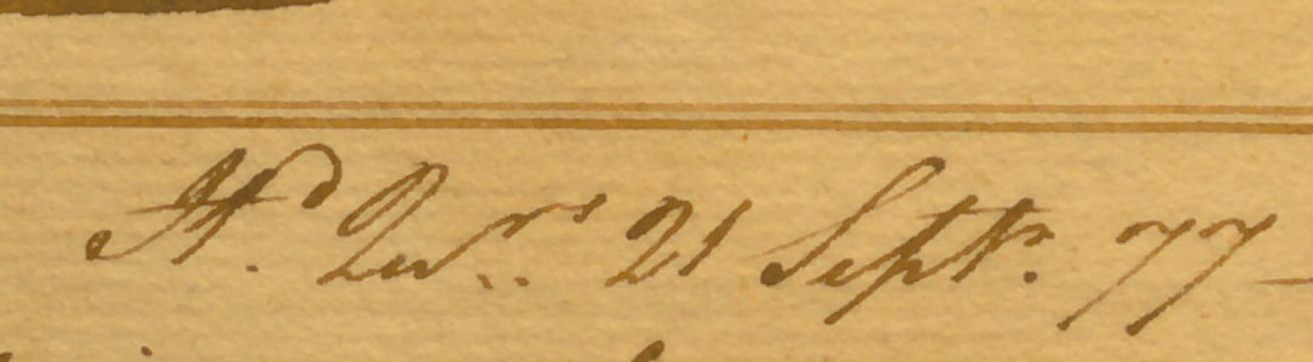H^d. Qu^rs. 21 Sept^r. 77
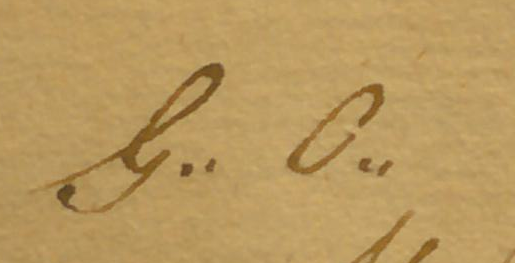G. O.
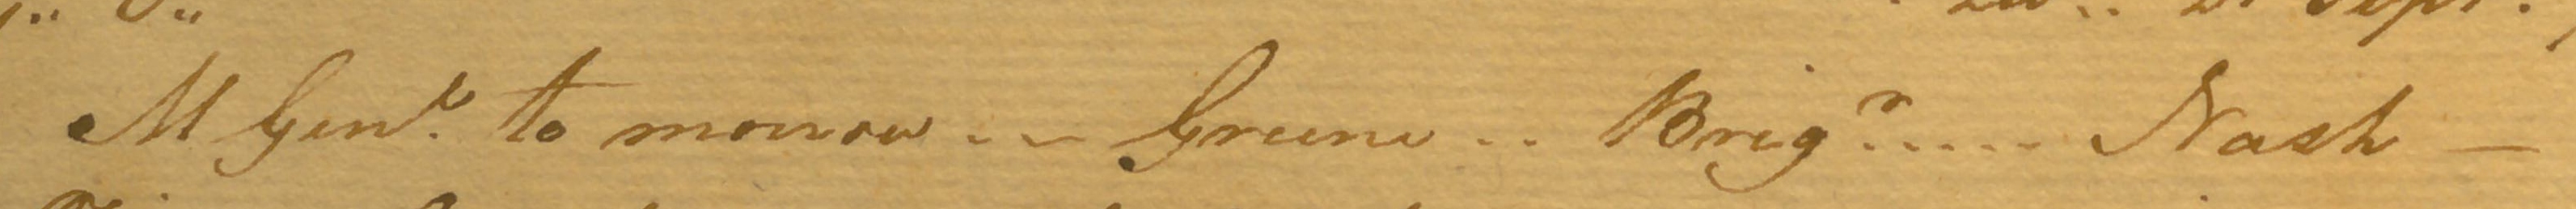M Gen^l. to morrow.. Greene.. Brig^r..... Nash-
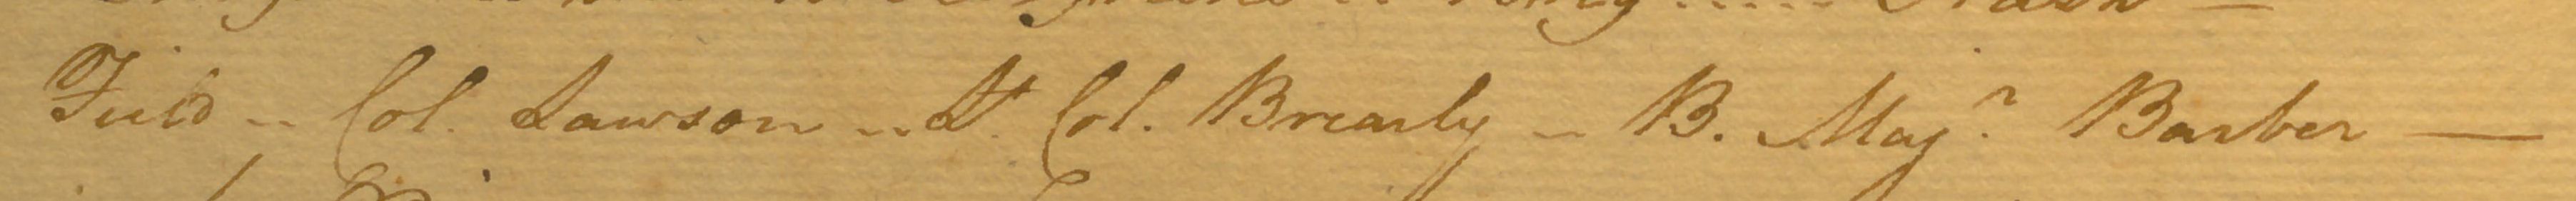Field.. Col. Lawson.. L^t. Col. Breanly- B. Maj^r. Barber-
